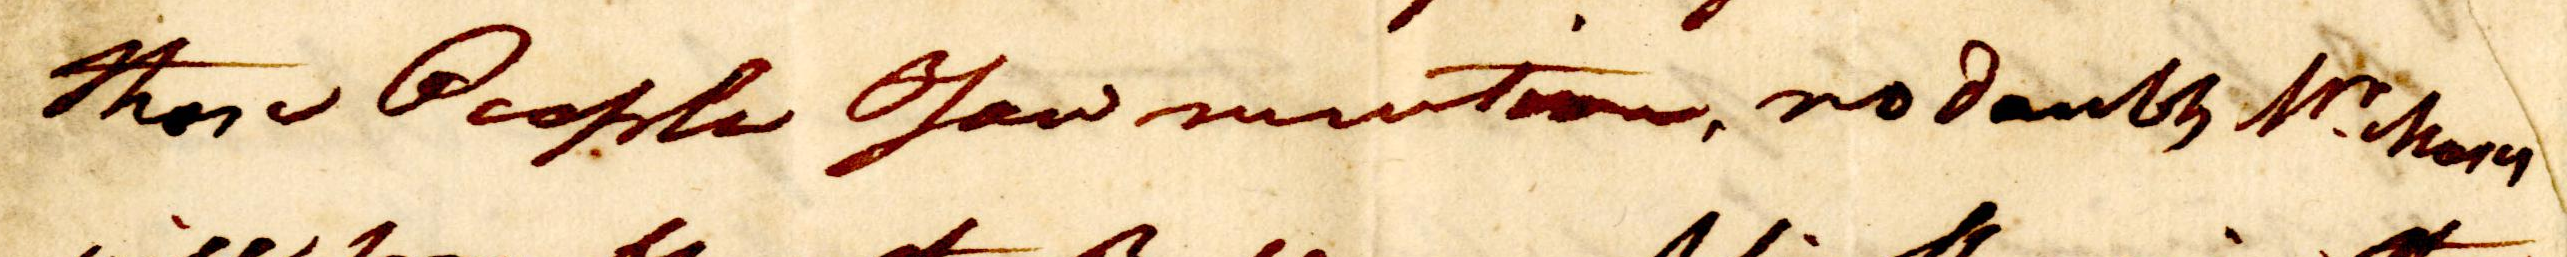those People you mention, no debts M^r. Moses
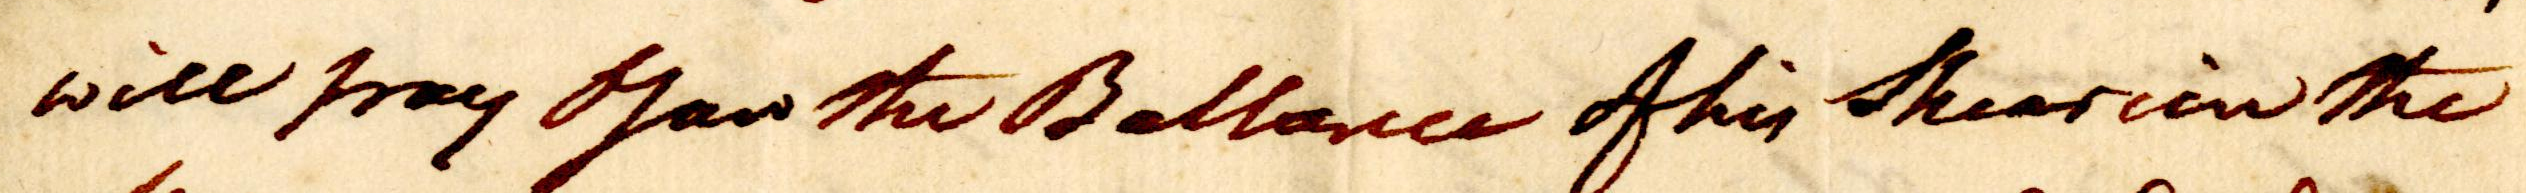will pay you the Balanace of his Shear in the
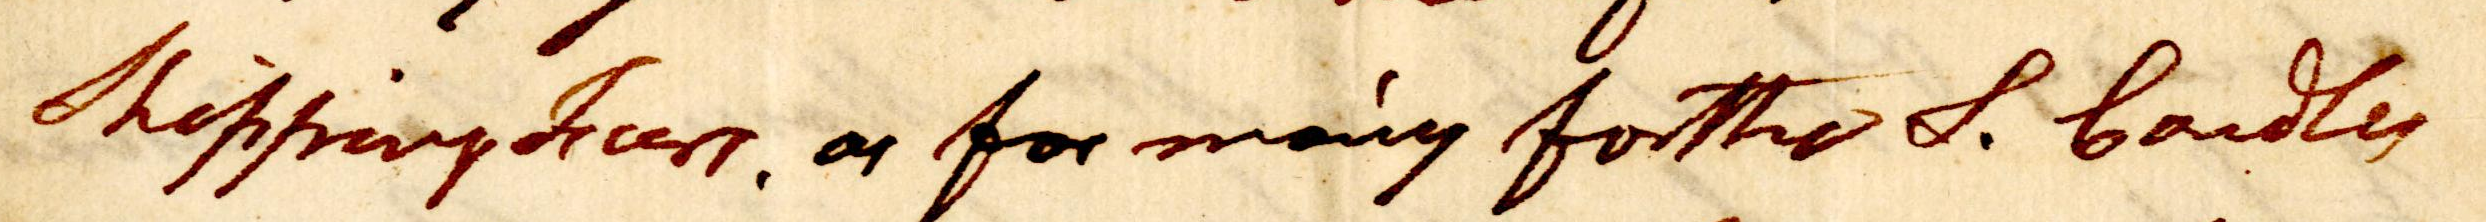Shipping Furs, as for moving for the S. Candles
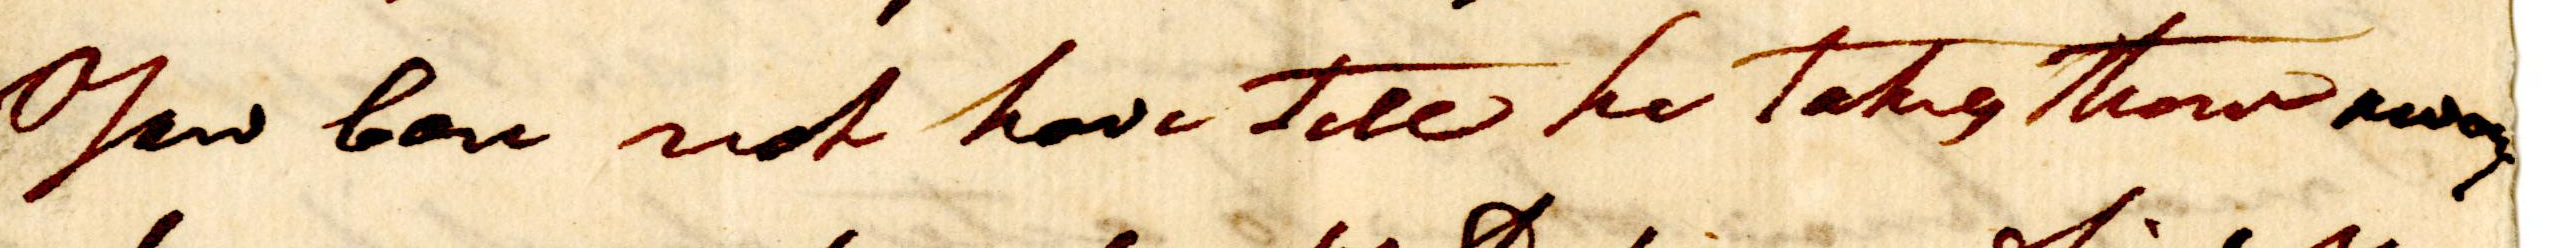You can not have till he takes them away
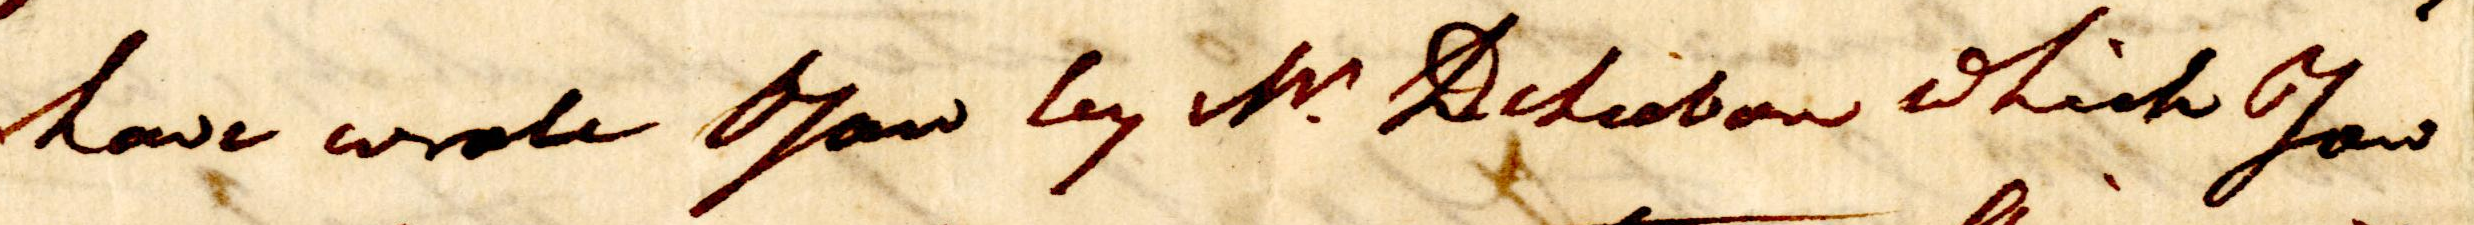have wrote you by M^r Delaborn which you
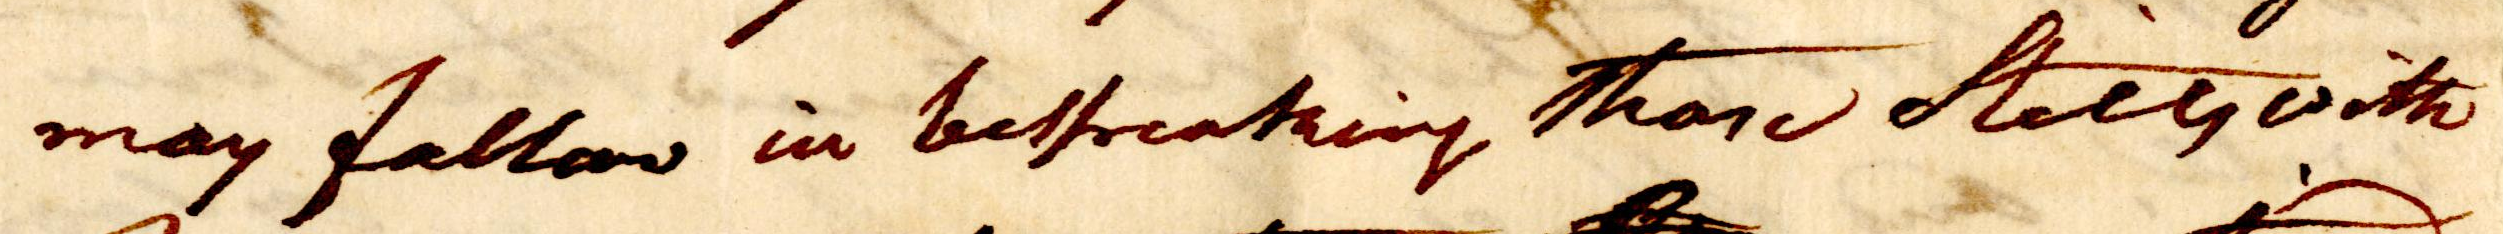may follow in bespeaking those Stills with
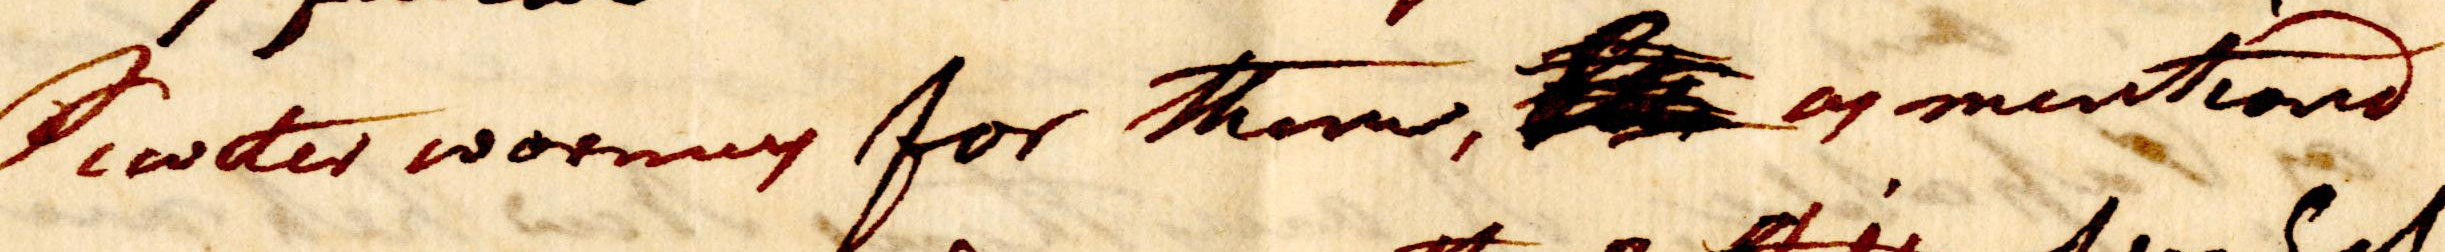Pewter worms for them, [___] as mentiond
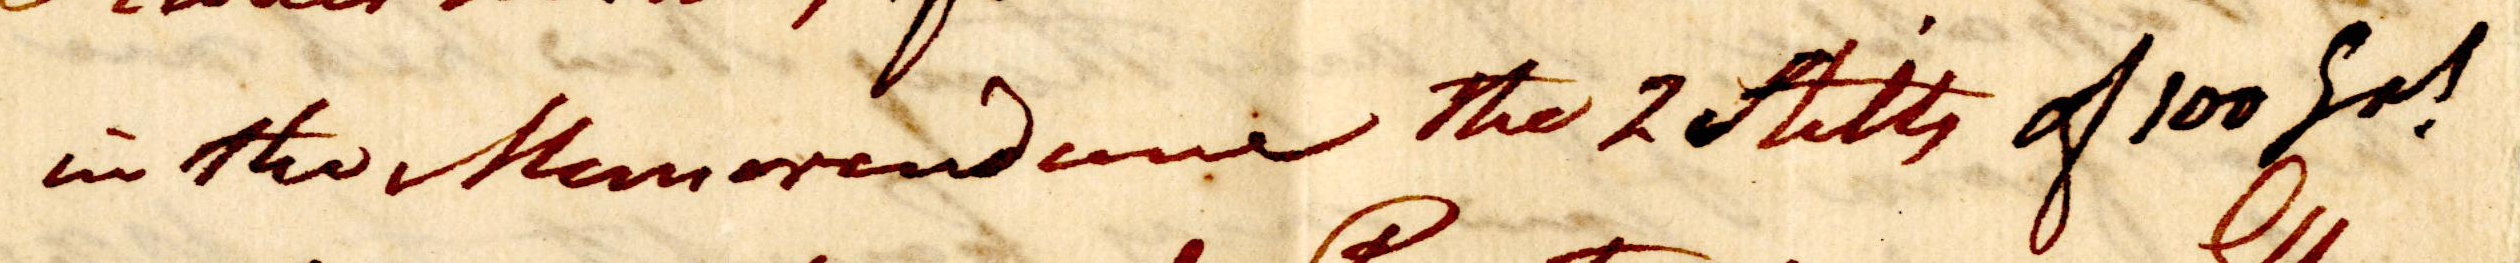in the Memorandum the 2 Stills of 100 Sr^g.
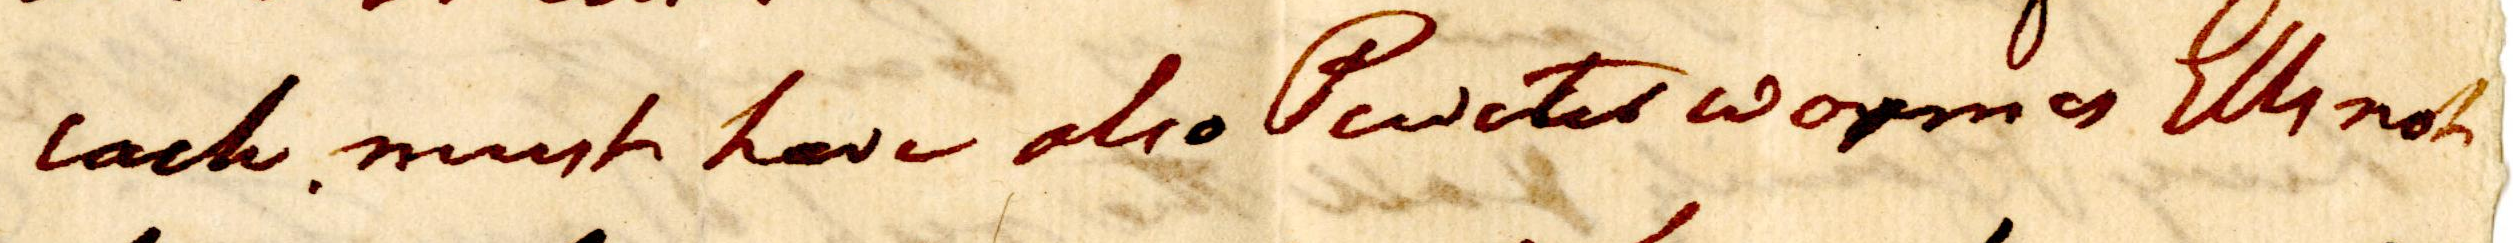each, must have also Pewter worms Ells not
